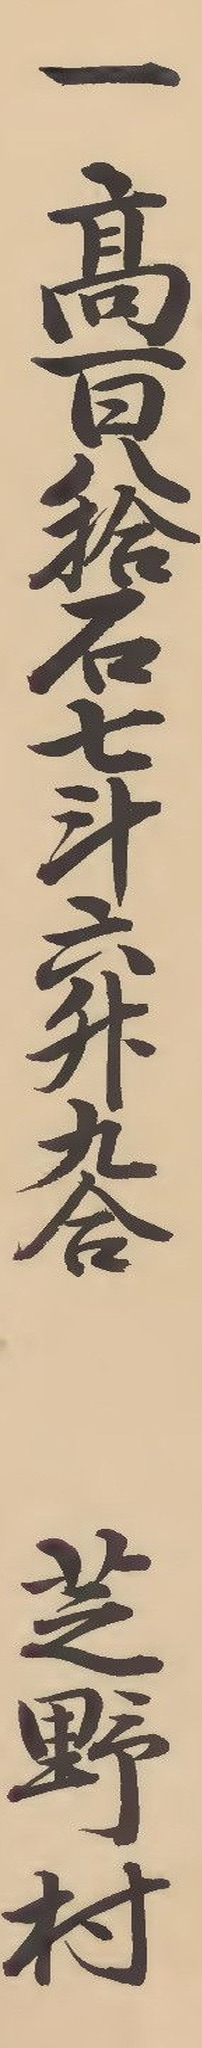一高百八拾石七斗六升九合芝野村
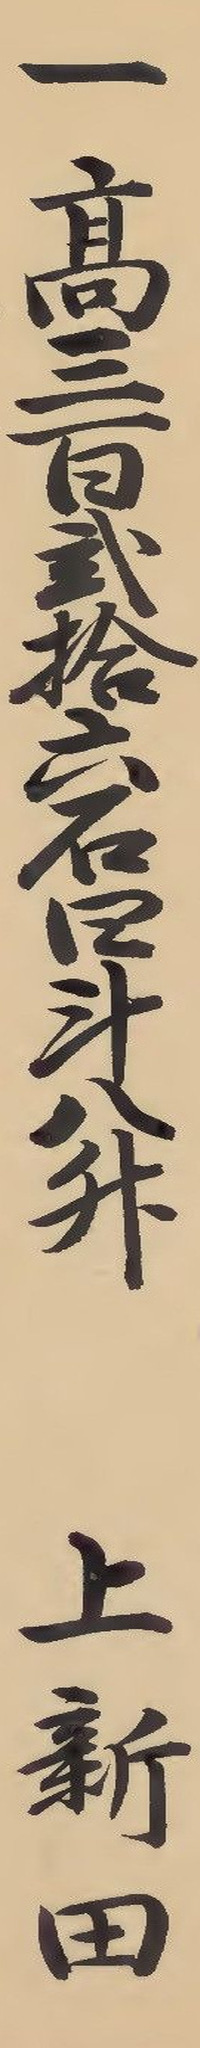一高三百弐拾六石四斗八升上新田
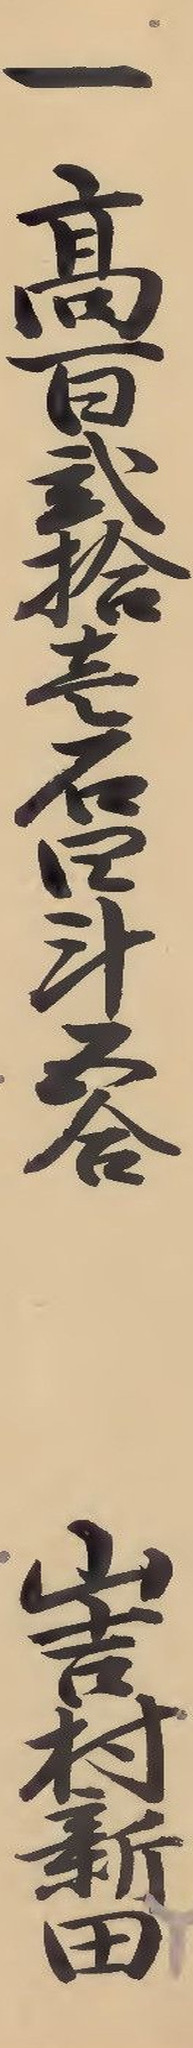一高百弐拾壱石四斗五合山吉村新田
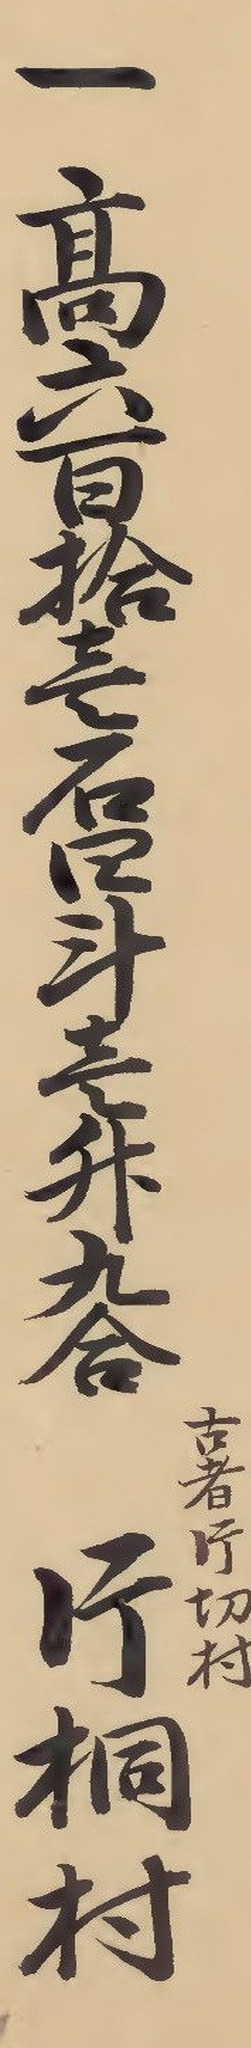一高六百拾壱石四斗壱升九合片桐村
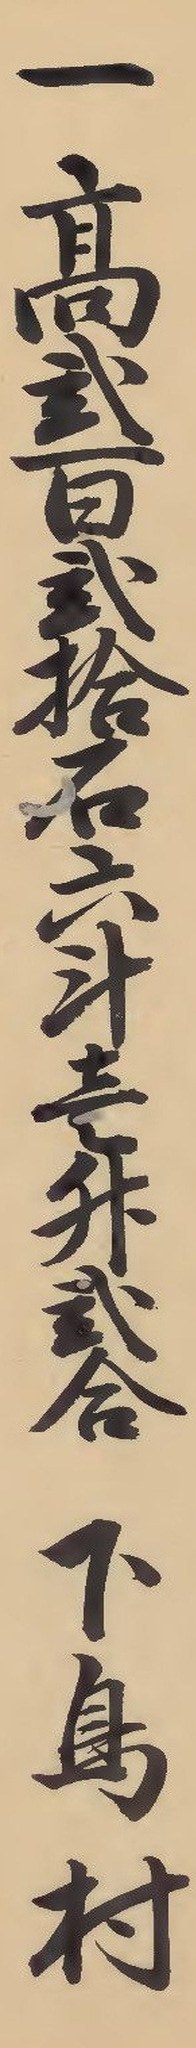一高弐百弐拾石六斗壱升弐合下鳥村

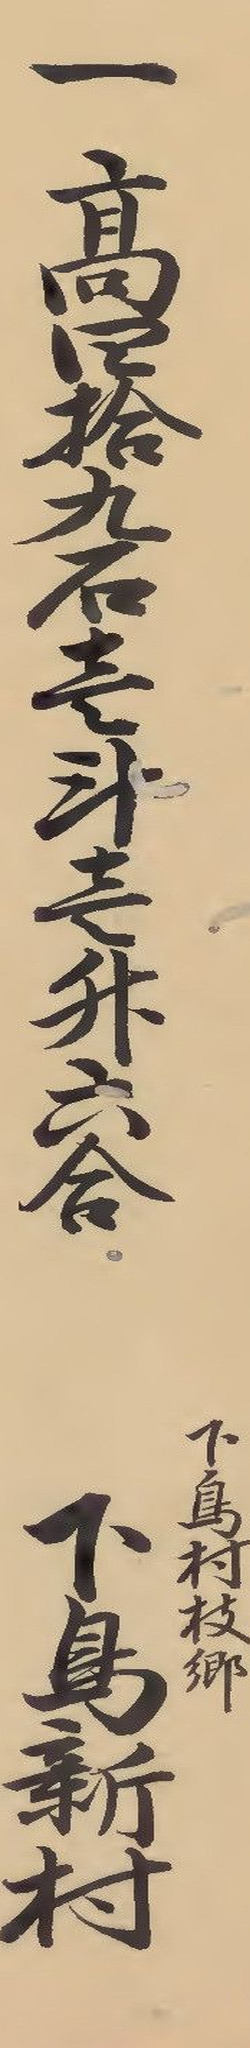一高四拾九石壱斗壱升六合下鳥新村
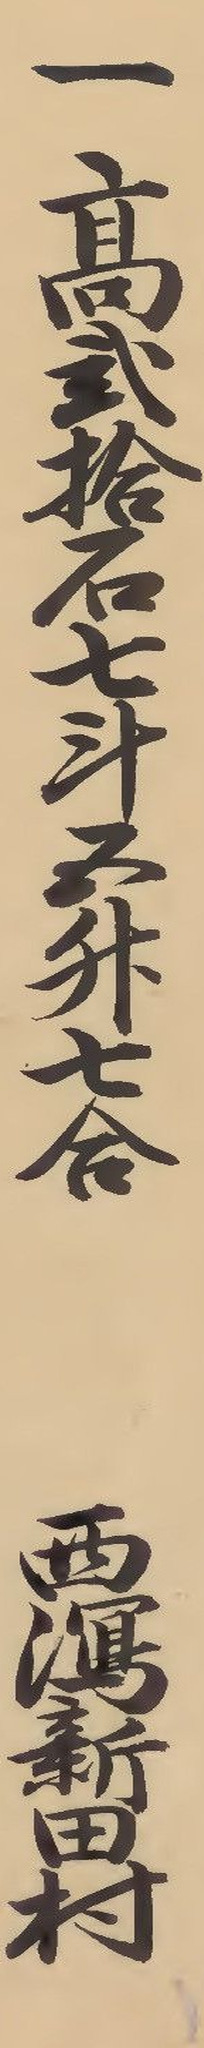一高弐拾石七斗五升七合西潟新田村
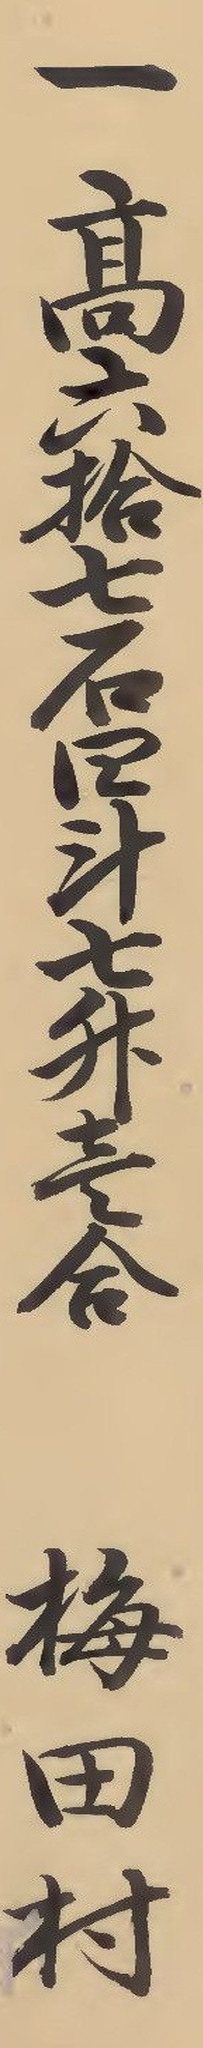一高六拾七石四斗七升壱合梅田村
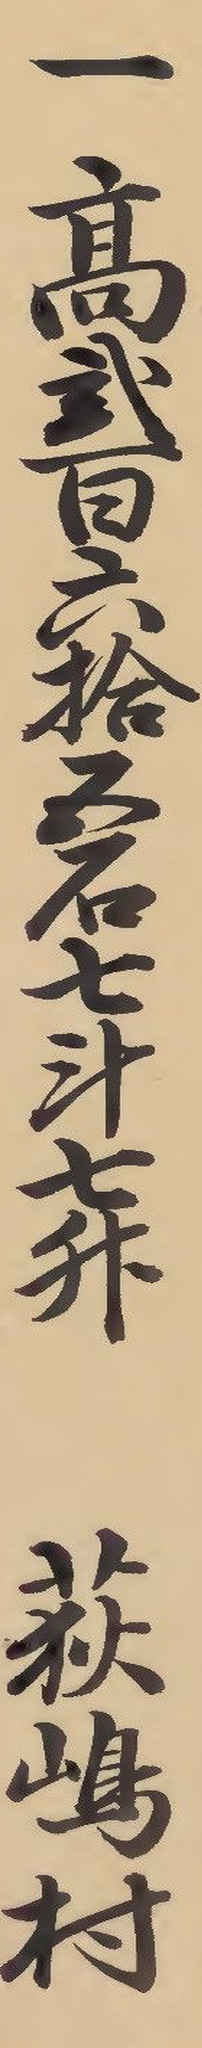一高弐百六拾五石七斗七升荻島村
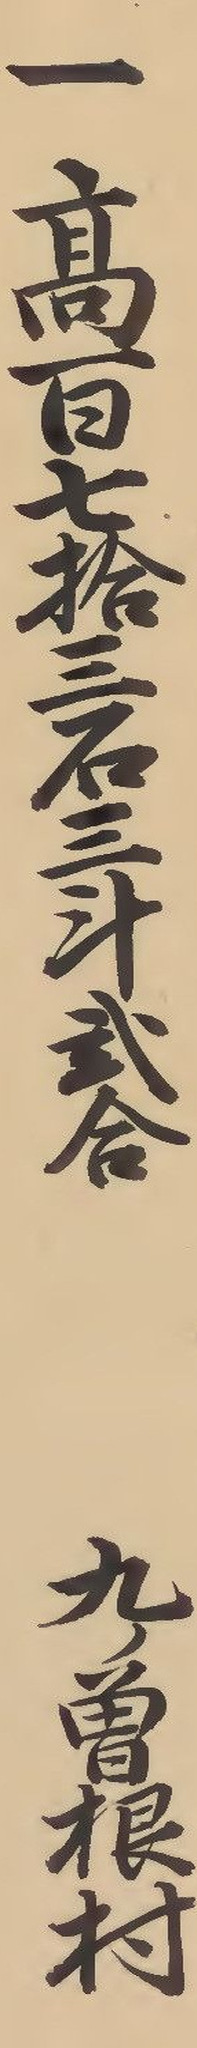一高百七拾三石三斗弐合九ノ曽根村
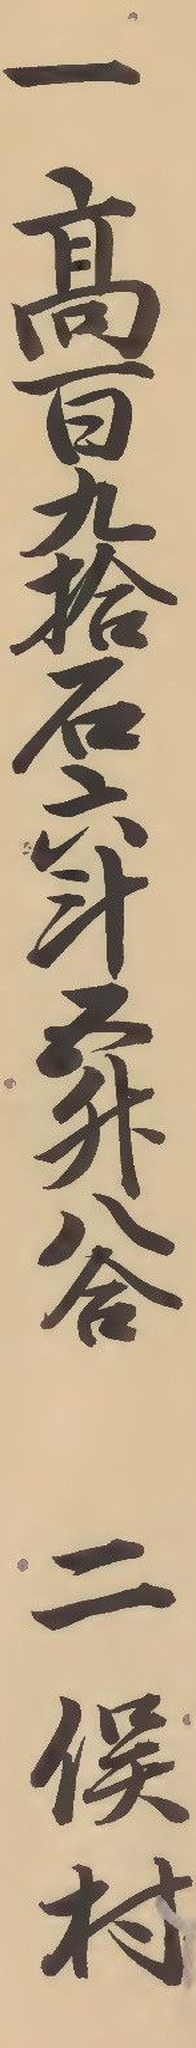一高百九拾石六斗五升八合二俣村
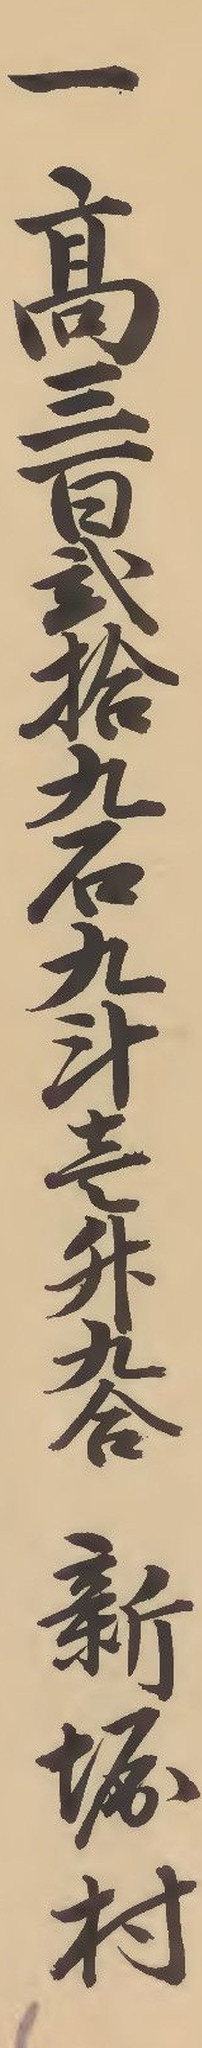一高三百弐拾九石九斗壱升九合新堀村
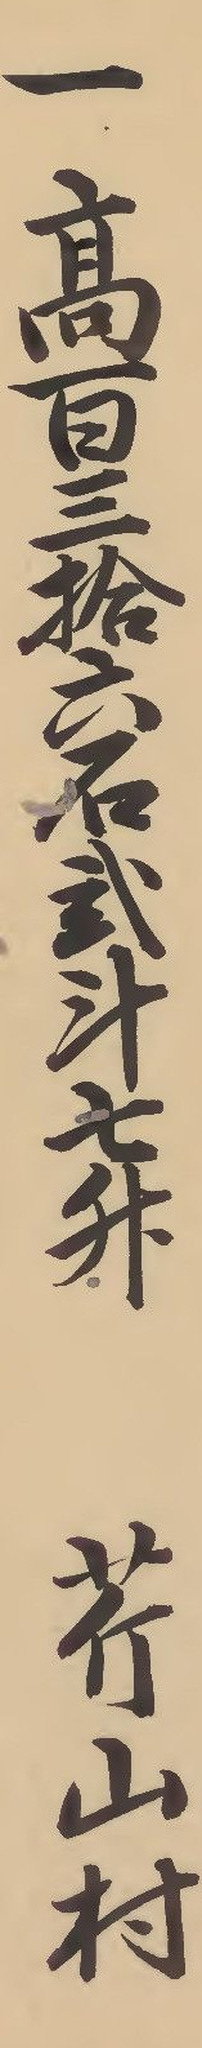一高百三拾六石弐斗七升芹山村

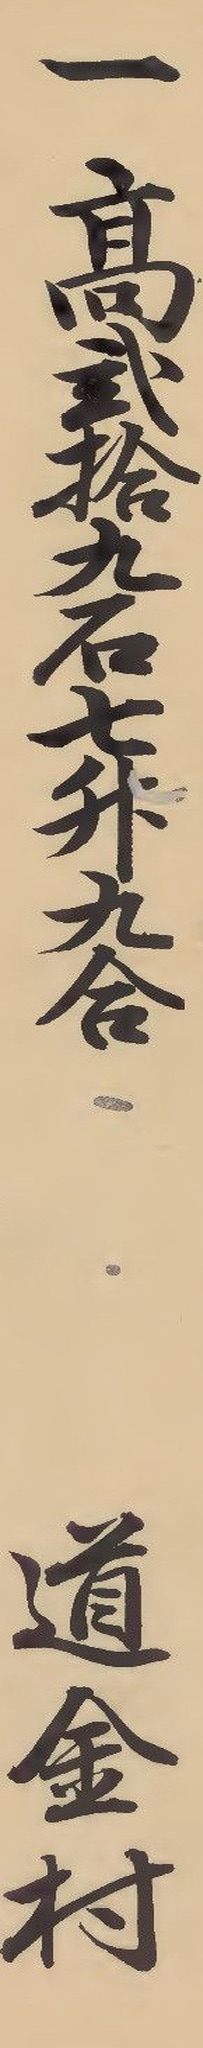一高弐拾九石七升九合道金村
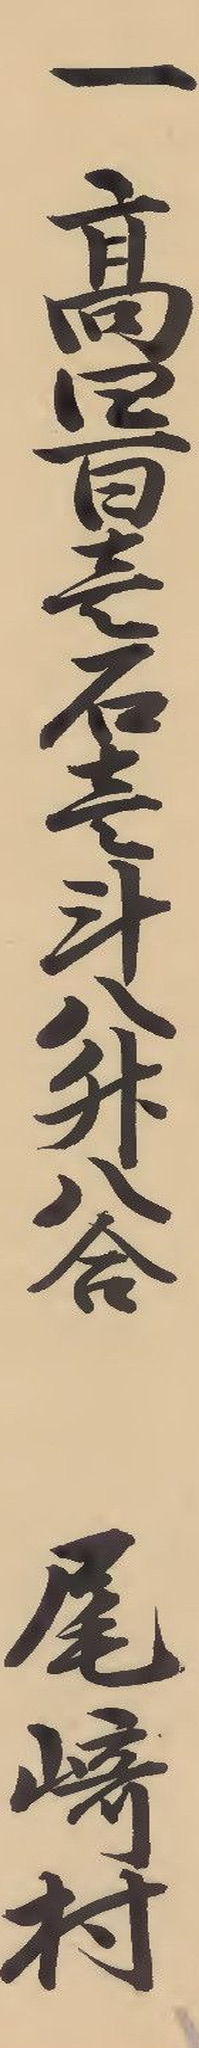一高四百壱石壱斗八升八合尾崎村
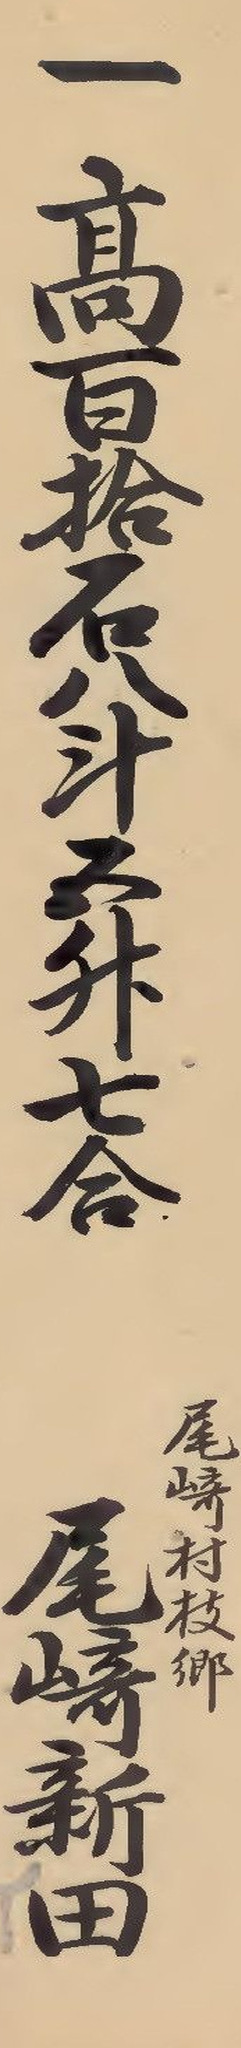一高百拾石八斗五升七合尾崎新田
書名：越後国郷帳　下
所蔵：国立公文書館 National Archives of Japan
